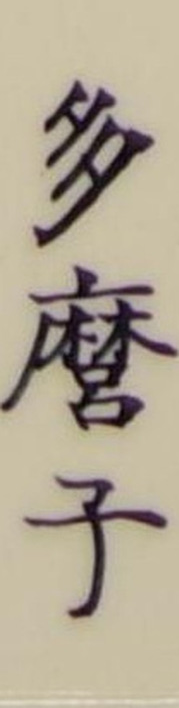多麿子
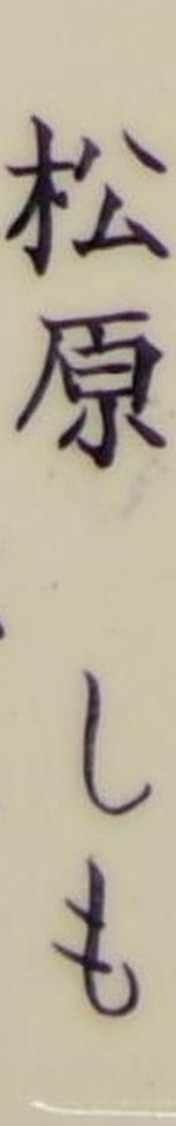松原しも
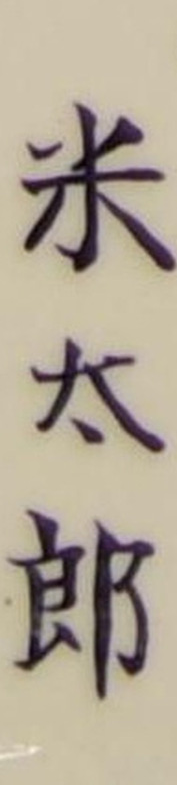米太郎

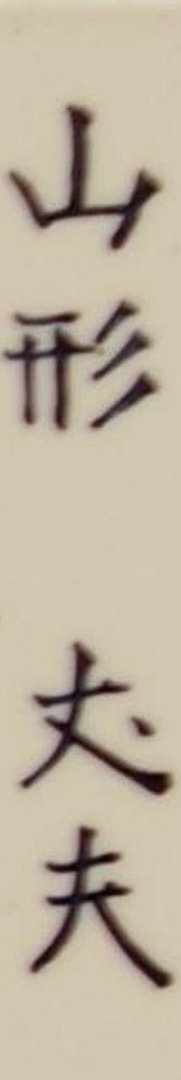山形丈夫
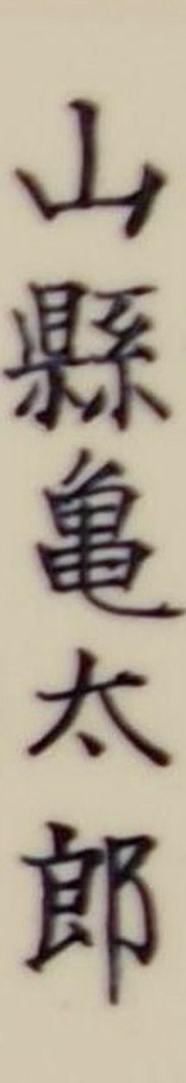山縣亀太郎
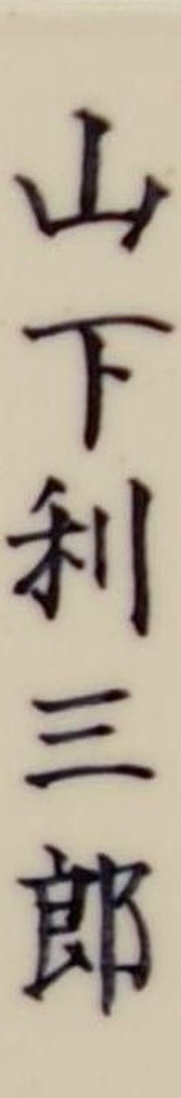山下利三郎
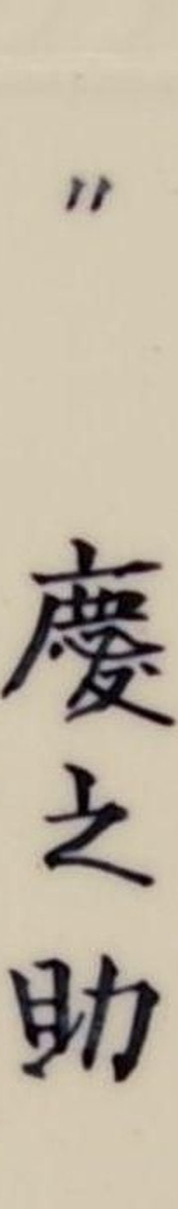慶之助
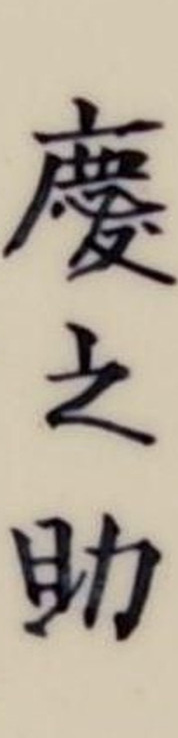慶之助
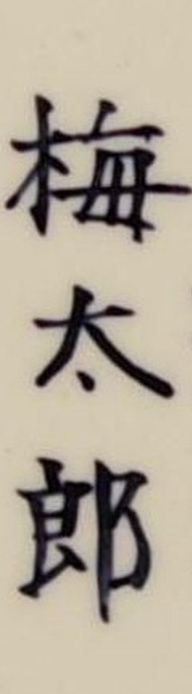梅太郎
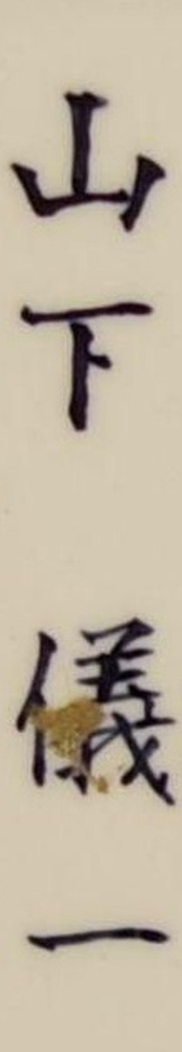山下儀一
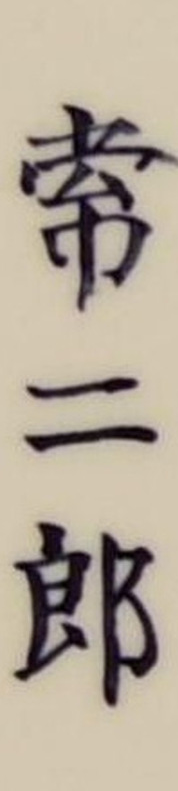常二郎
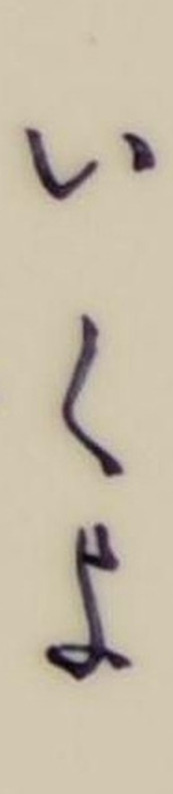いくよ

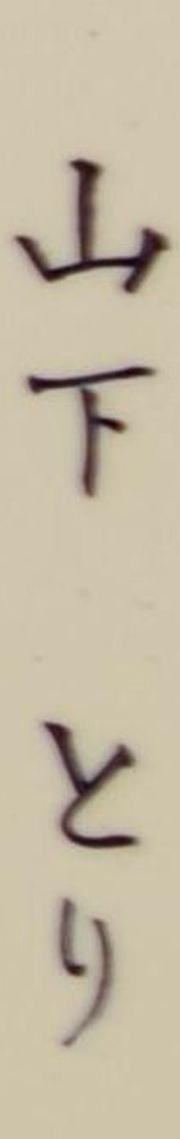山下とり
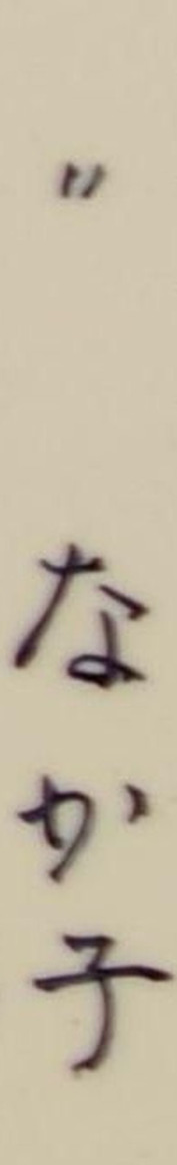なか子
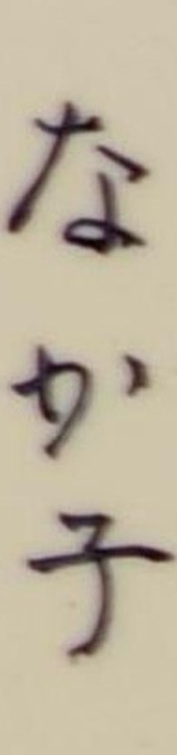なか子
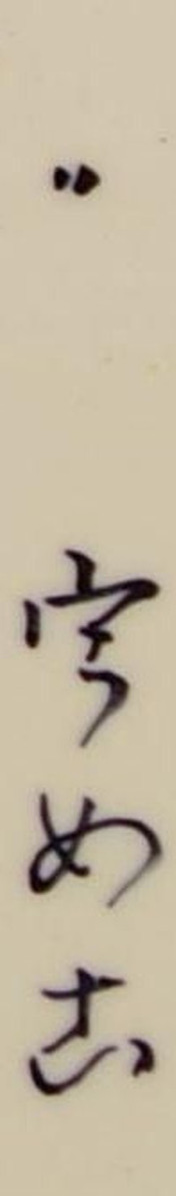うめこ
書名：A~D
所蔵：koyasan kongobuji
